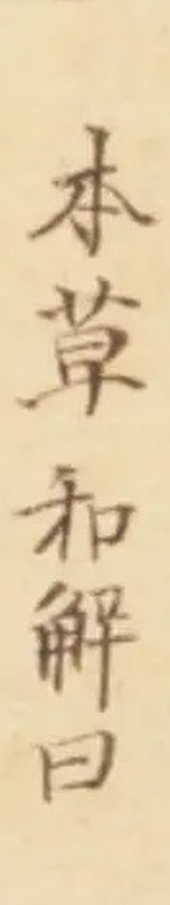本草和解曰
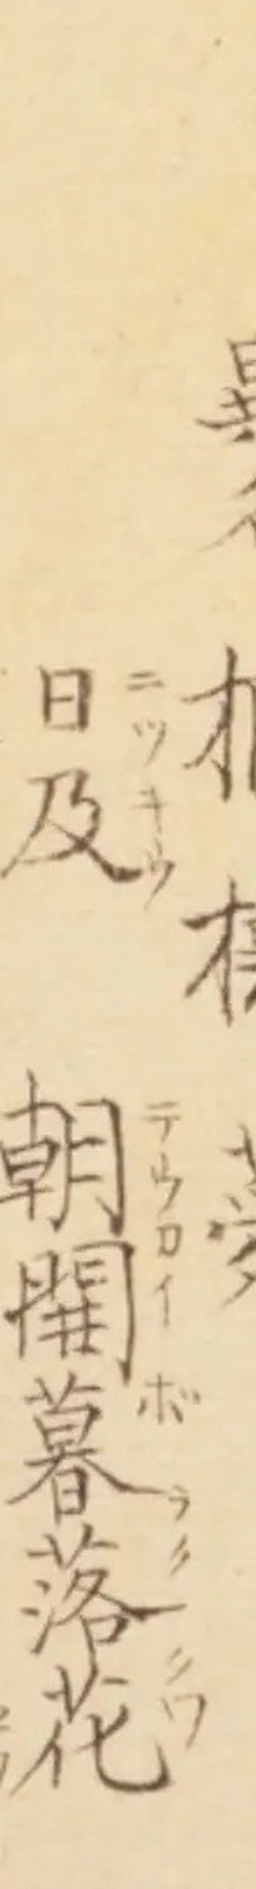日及朝開暮落花
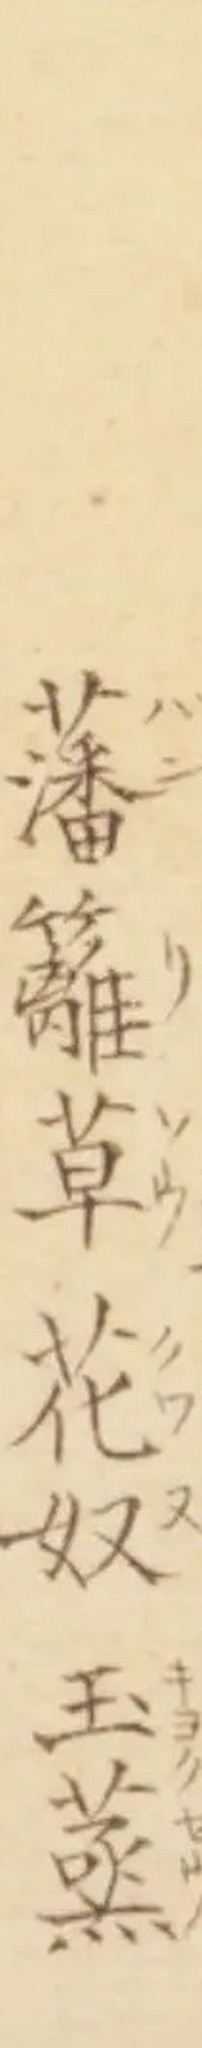藩籬草花奴玉蒸
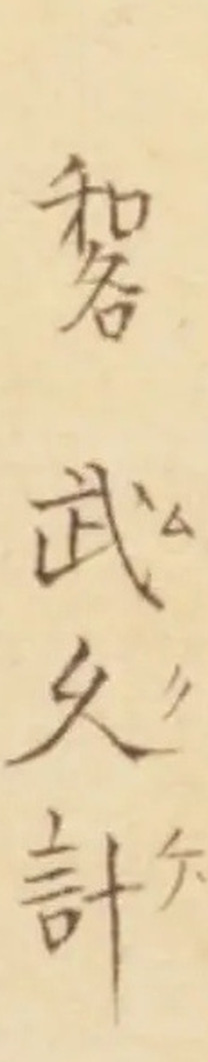和名武久計
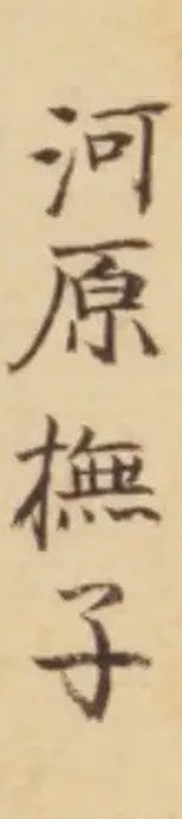河原撫子
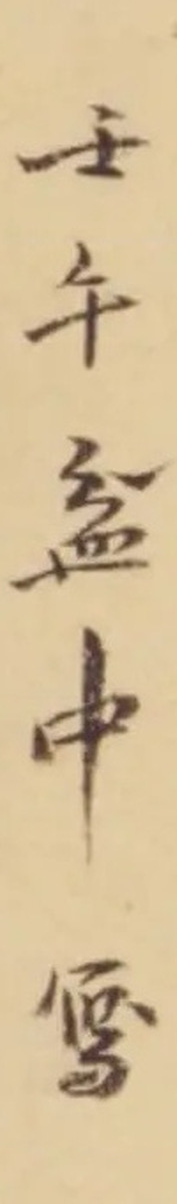壬午盆中写

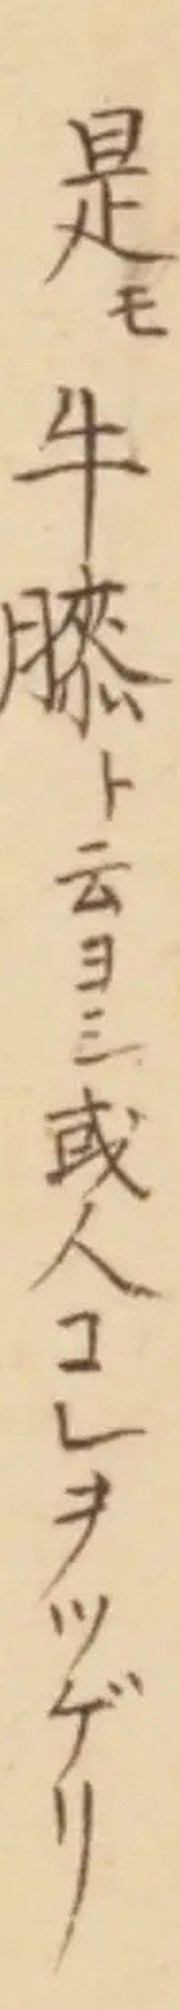是牛膝云ヨシ或人コレヲツゲリ
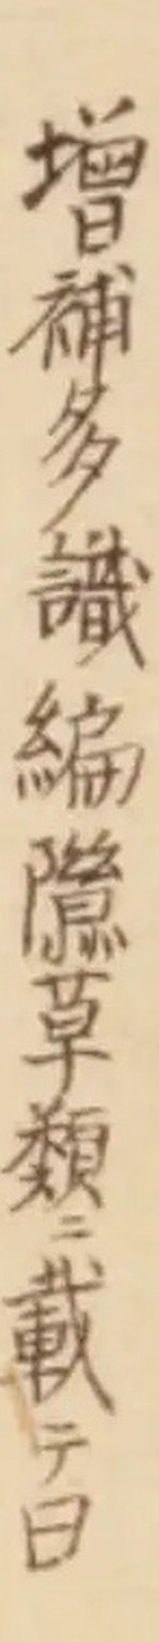増補多識編草類載テ曰
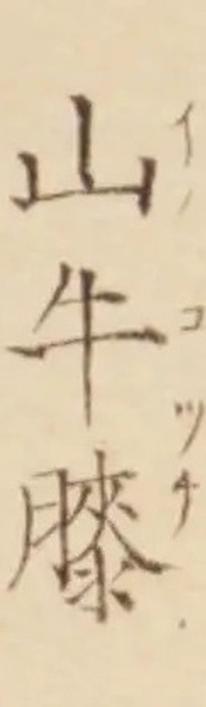山牛膝
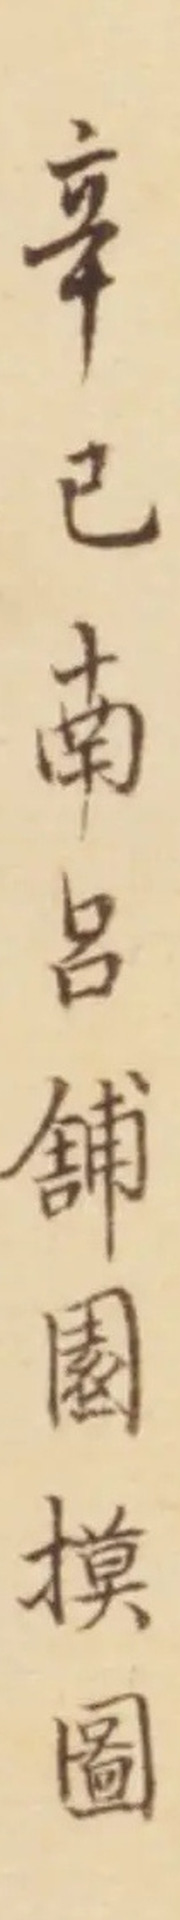辛巳南呂舗園摸図

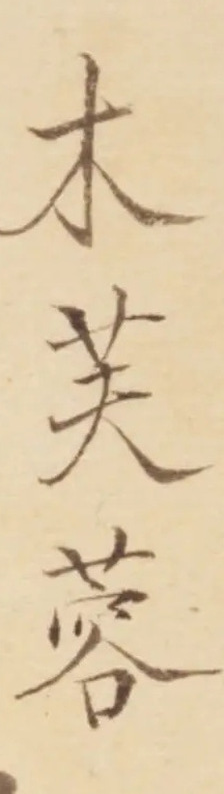木芙蓉
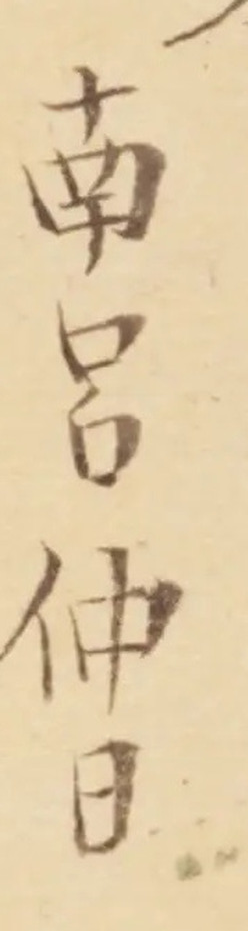南呂仲日

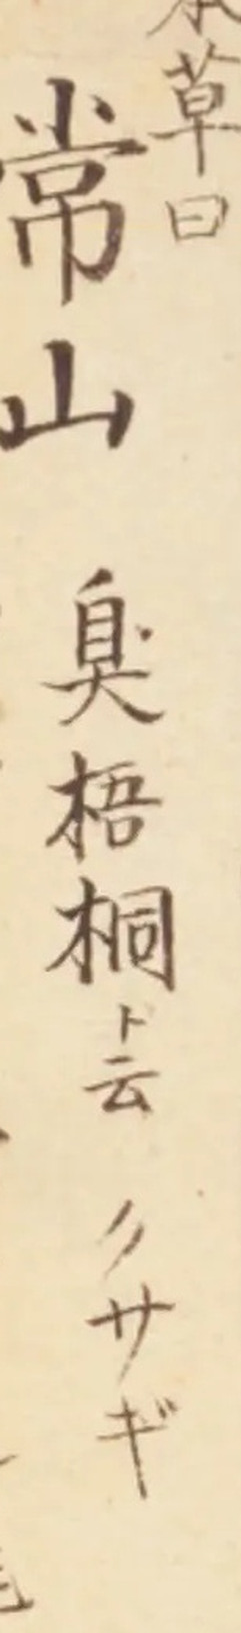常山臭梧桐ト云クサギ
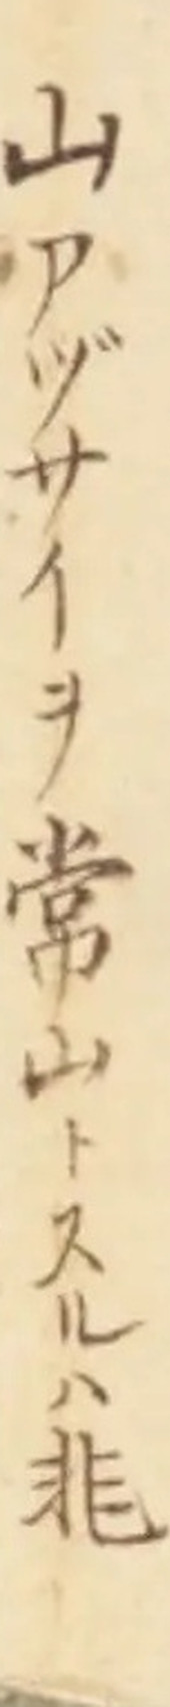山アヅサイヲ常山トスルハ非
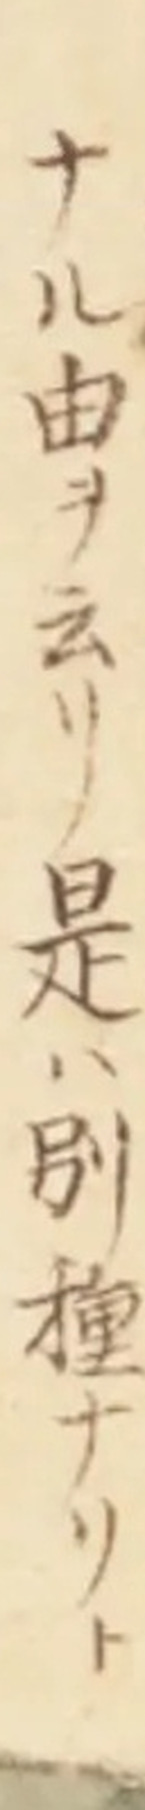ナル由ヲ云リ是ハ別種ナリト
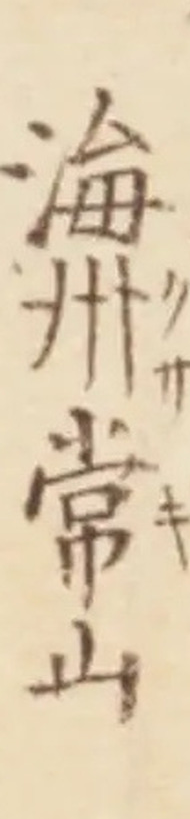海州常山
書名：梅園草木花譜秋之部. 1
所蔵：国立国会図書館 National Diet Library, JAPAN
